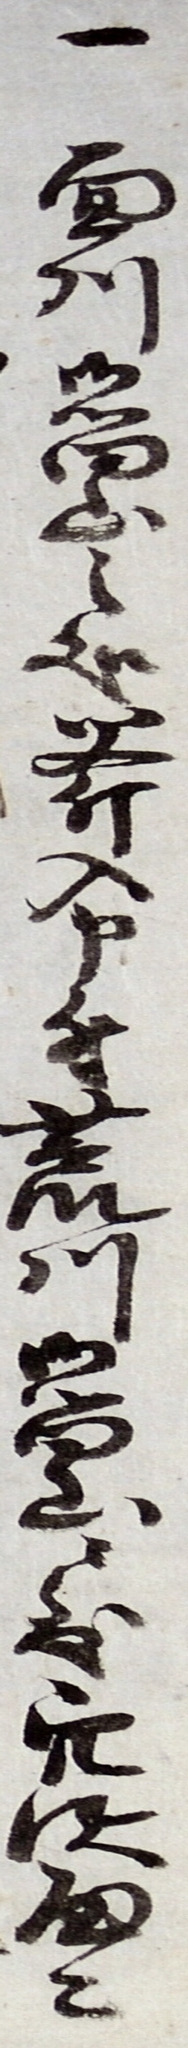一面川御笛山之処斧入申付荒川御笛山ニ致穴沢面々
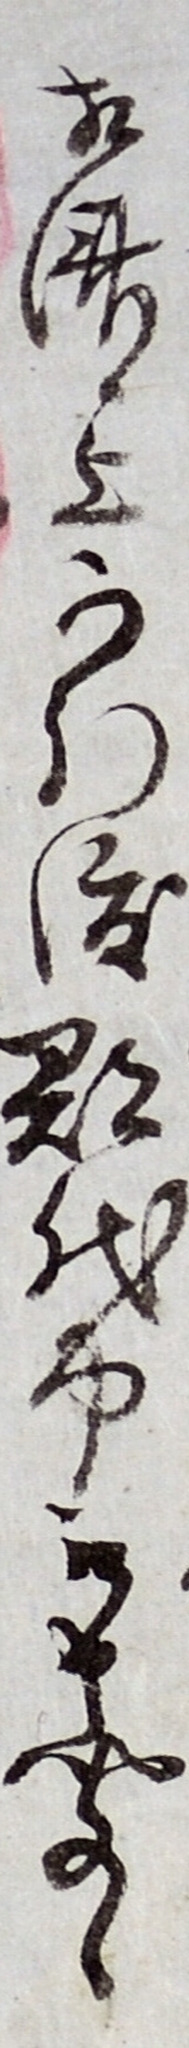相済候上可引渡郡代中江申聞候
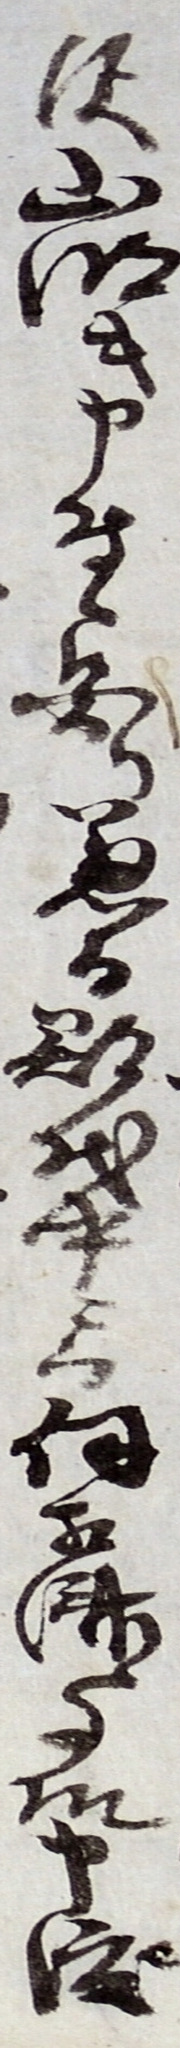沢山明キ申付候図り兼而郡代中ニ而伺相済候事故申渡
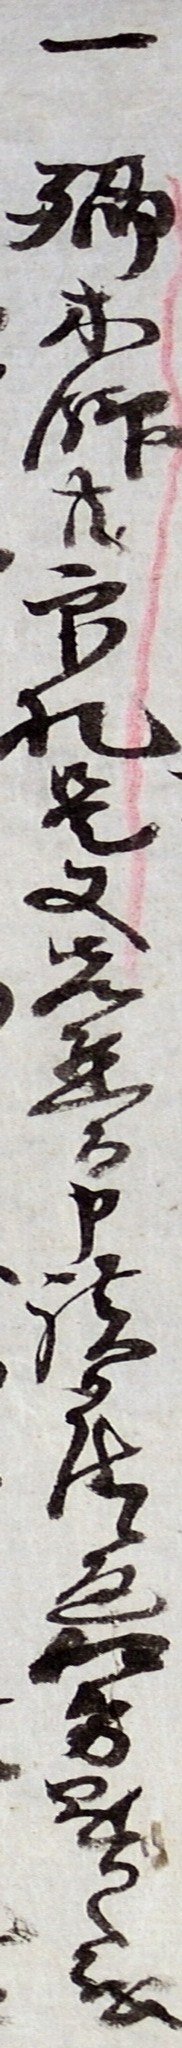一郷木師共印札是又先達而申談御座候通郷方懸り之義
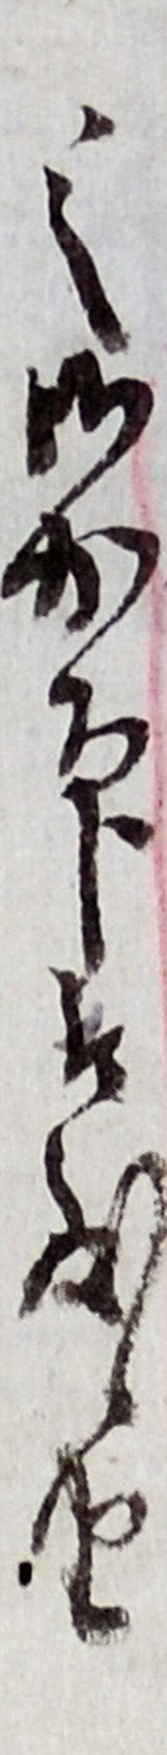之御加印被致候由
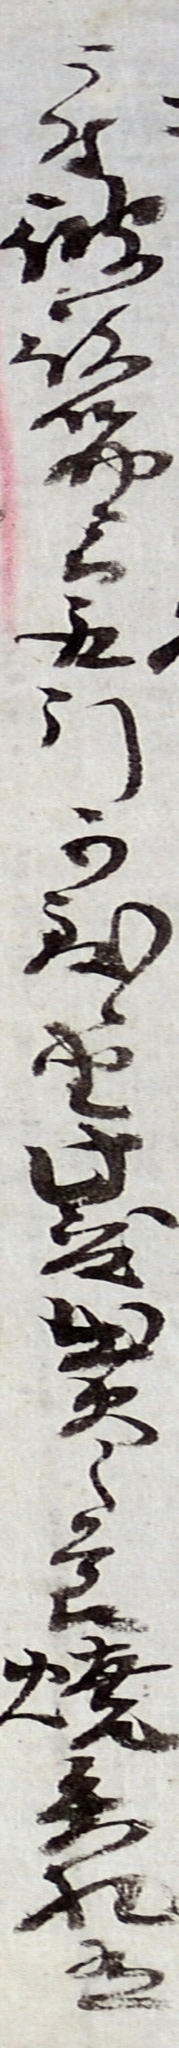ニ付彼役筋ニ而取引可致候由此度出火之節焼失札有
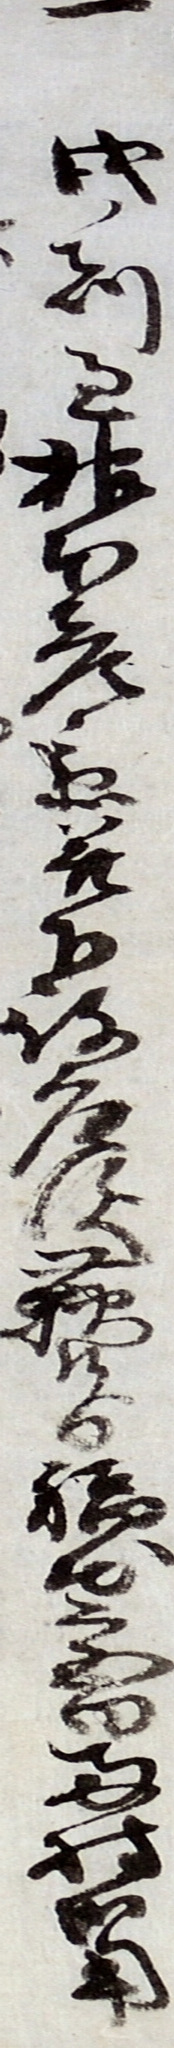一戌ノ刻過根本彦兵衛并下役唐沢萩左衛門福地宮田両村御用
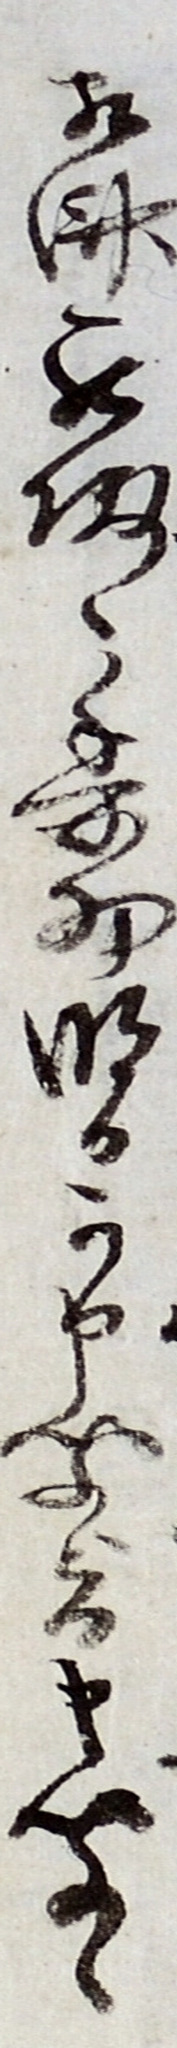相済罷帰候手委細明日可申聞旨申聞候
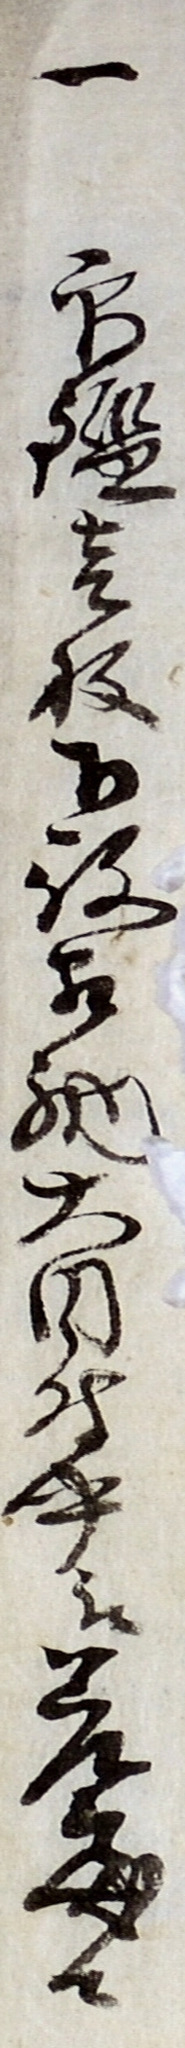一印鑑壱枚下役相納大目付中江差戻候
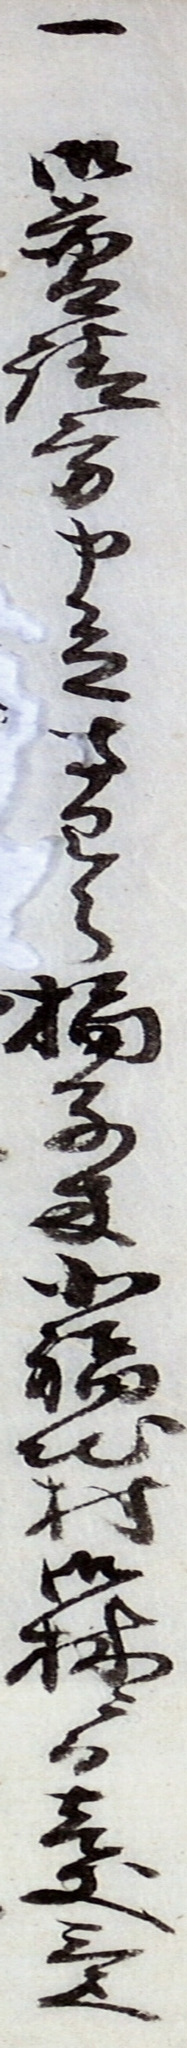一御普請方申立さわら桶子木北福地村御林ニ而壱丈三尺
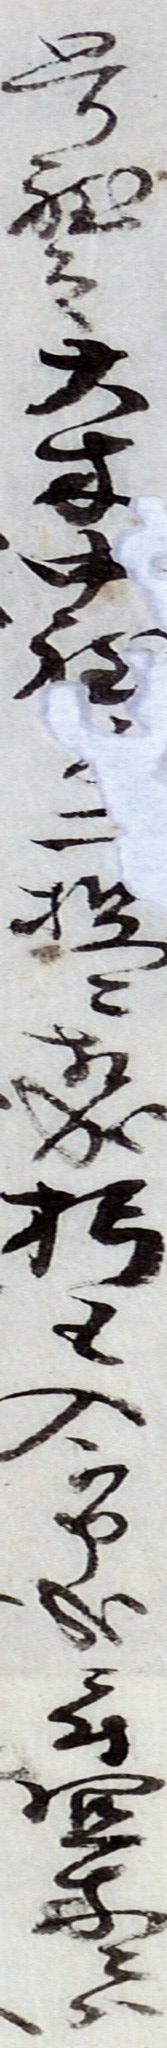廻り程之大木中程ゟ二股ニ相成朽も入可申哉ニ付宜木ニハ
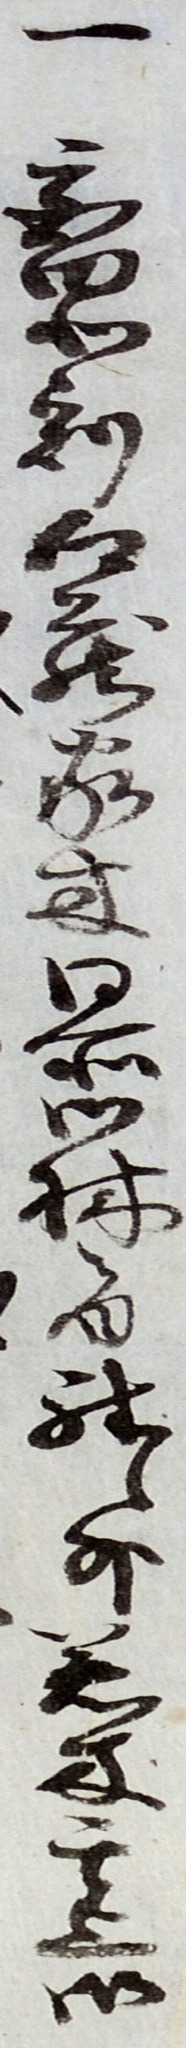一宮田北割御蔵家木同所御林者殊之外若木其上御
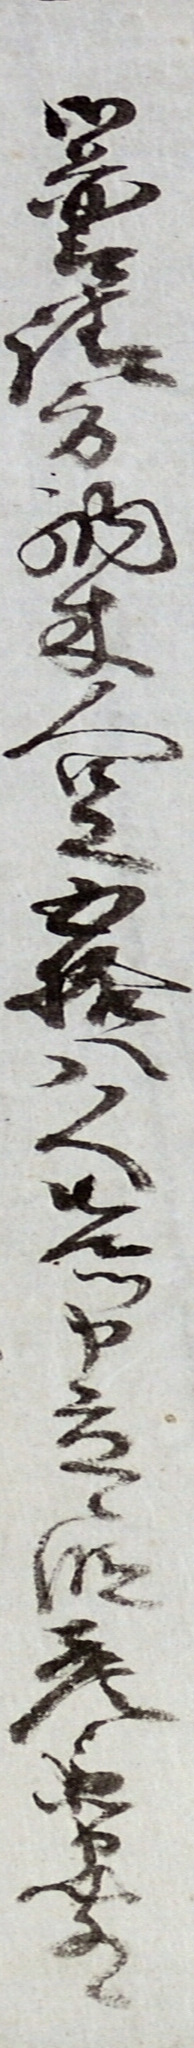一御普請方納木人足五拾八人先ツ申立候段彦兵衛申聞候
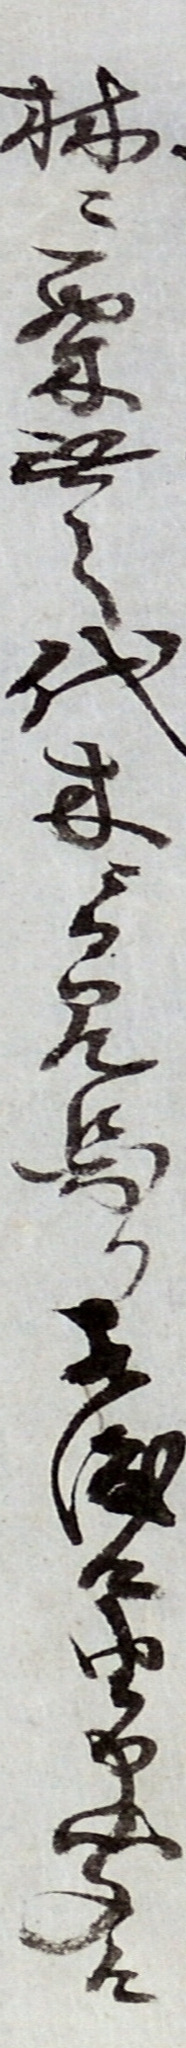林ニ栗無之代木ニ而見図り相渡候由申聞候
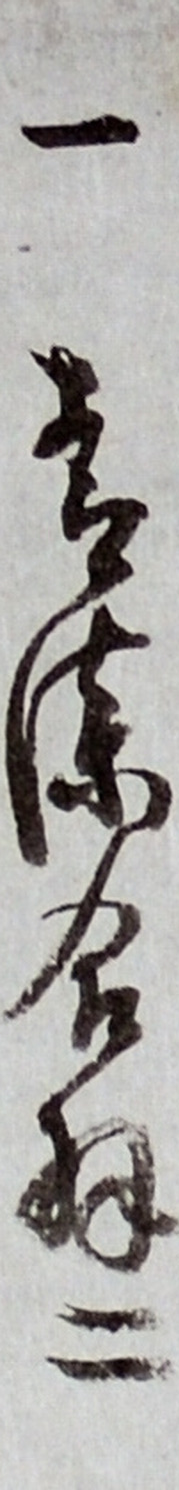一青漆合羽二
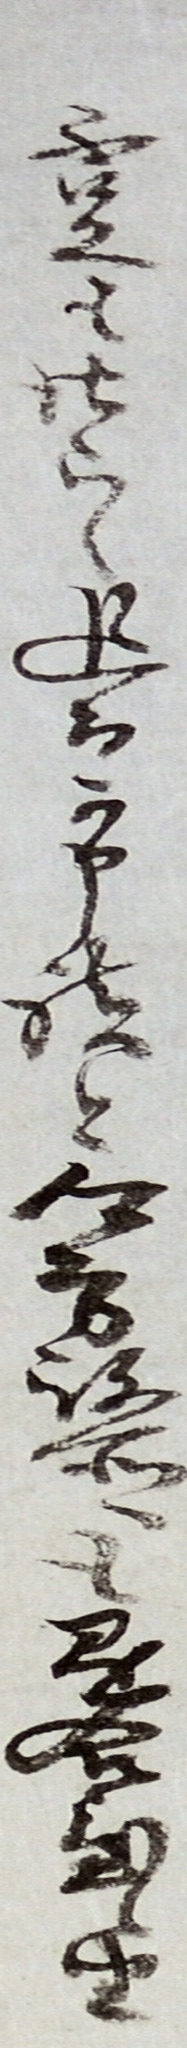不足も仕候ハヽ追而可申談と郷方役所へも懸合度候由
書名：御山奉行御用留
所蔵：伊那市立高遠町図書館・合同会社AMANE
